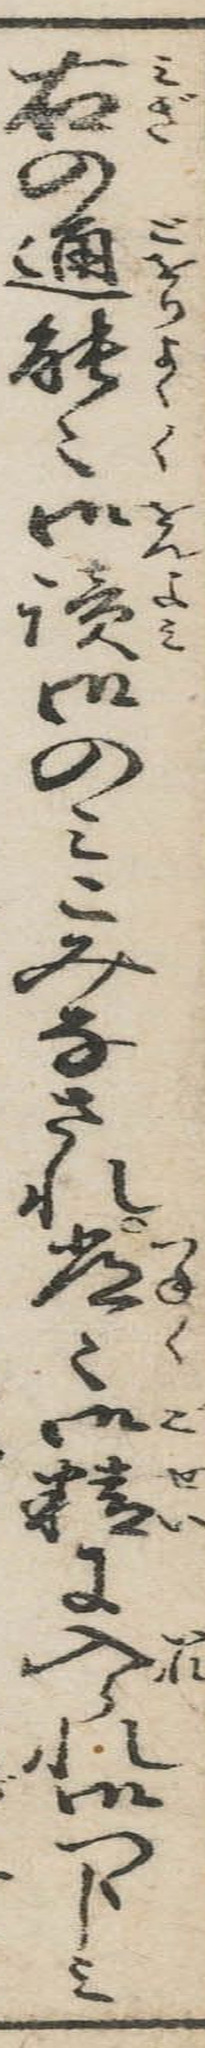右の通能々御読御のみこみなされ。常々御精に入れ御つゝしみ
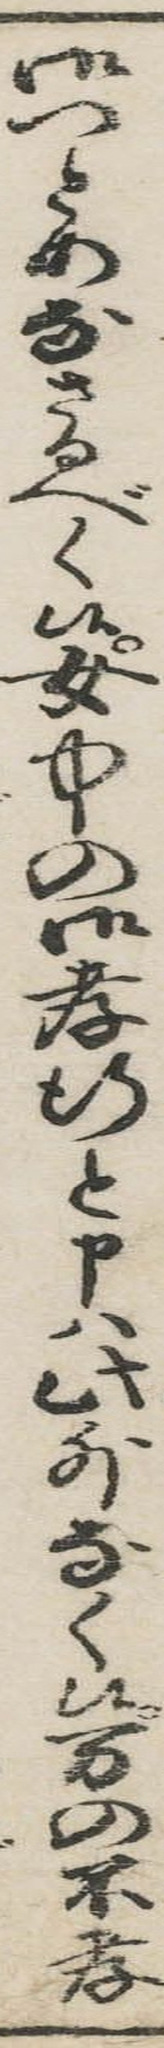御つとめなさるべく候。女中の御孝行と申は此外なく候。万の不孝
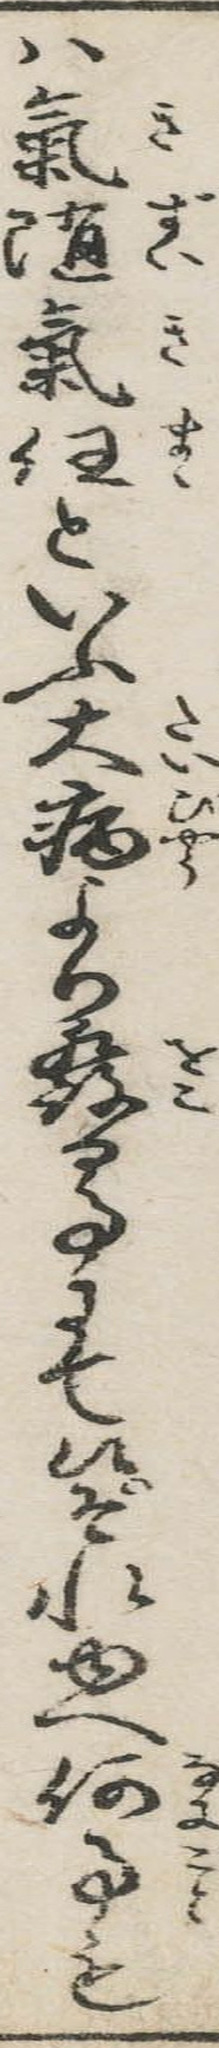は気随気任といふ大病より発る事にて候。それゆへ何事も
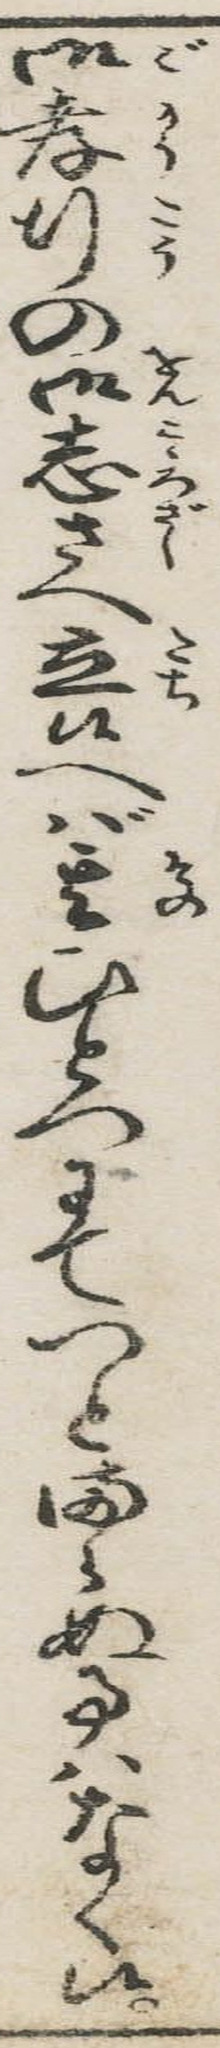御孝行の御志さへ立候へば其ひとつにてつとまらぬ事はなく候
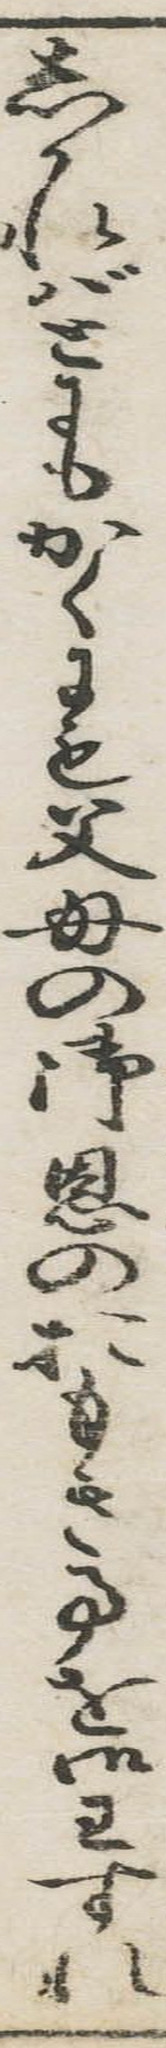しかればとにもかくにも父母の御恩のおもき事を御わすれ
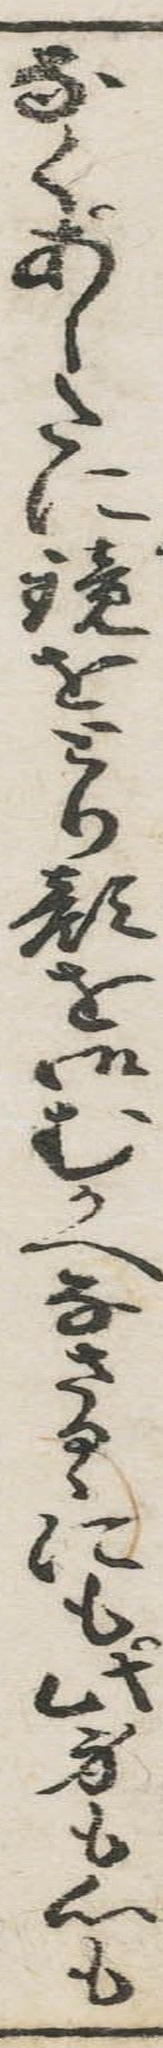なく。あしたに鏡をとり顔を御むかへなさるゝにも。此身も心も
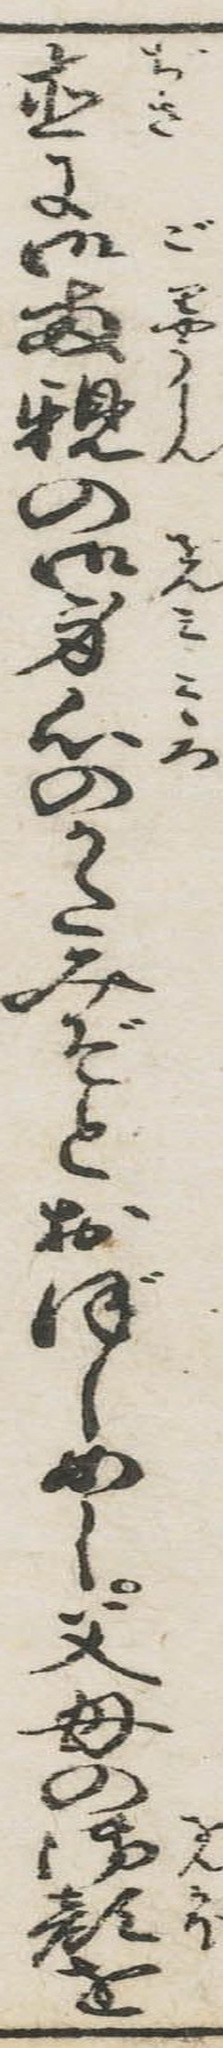直に御両親の御身心のかたみぞとおぼしめし。父母の御顔を
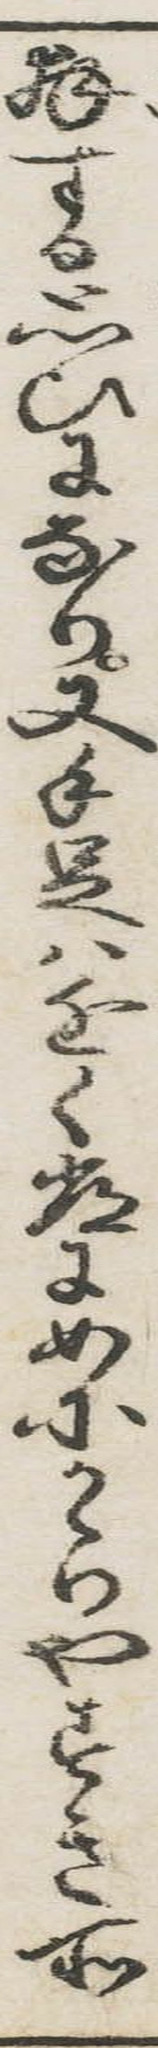拝する思ひになり。又手足は近く常にめにかゝりやすき所
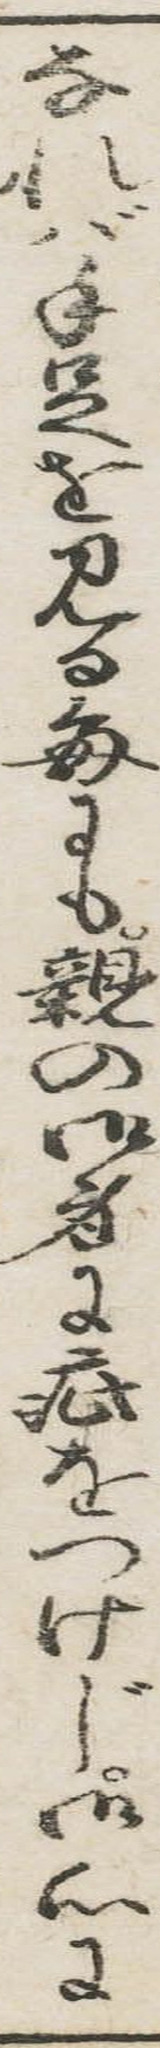なれば手足を見る毎にも親の御身に疵をつけじ。御心に
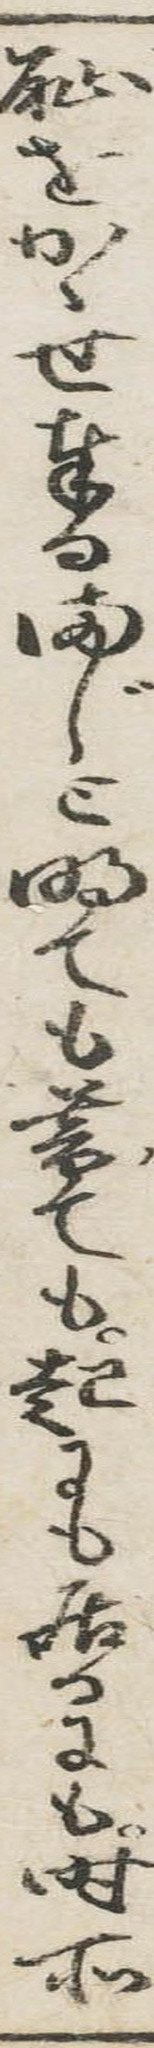恥をかゝせ奉るまじと明ても暮ても。起にも居るにも。時所
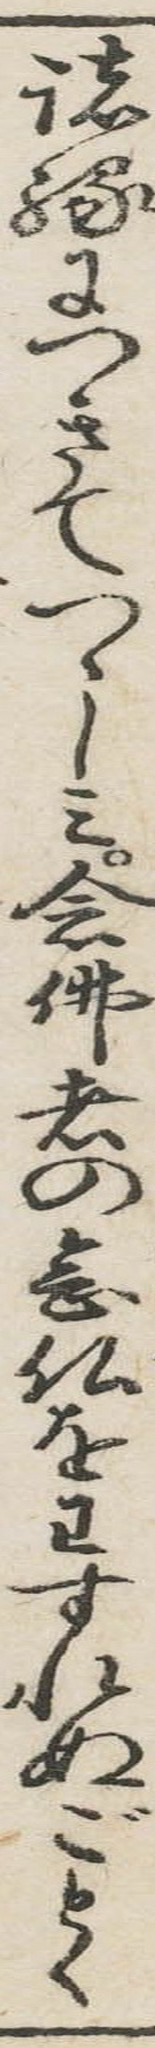諸縁につきてつゝしみ。念仏者の念仏をわすれぬごとく
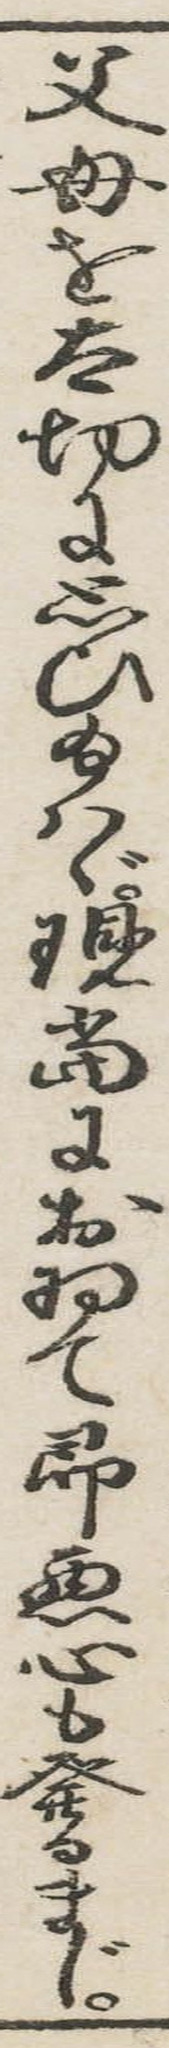父母を太切に思ひ給はゞ現当におゐて即悪心も発るまじ。
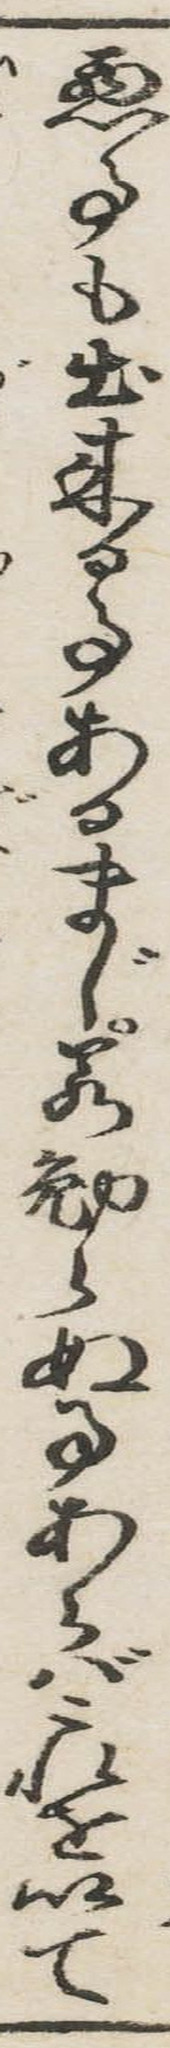悪事も出来る事あるまじ。若勉らぬ事あらばこれを以て
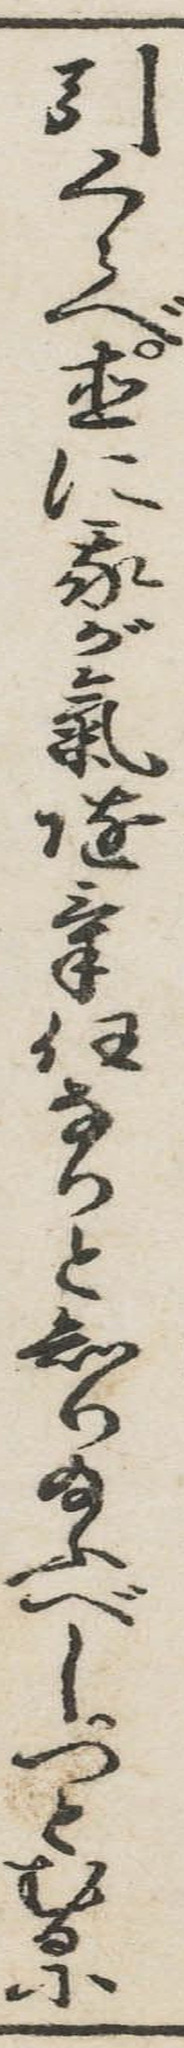引くらべ。直に我が気随気任なりと知り給ふべし。つとむるに
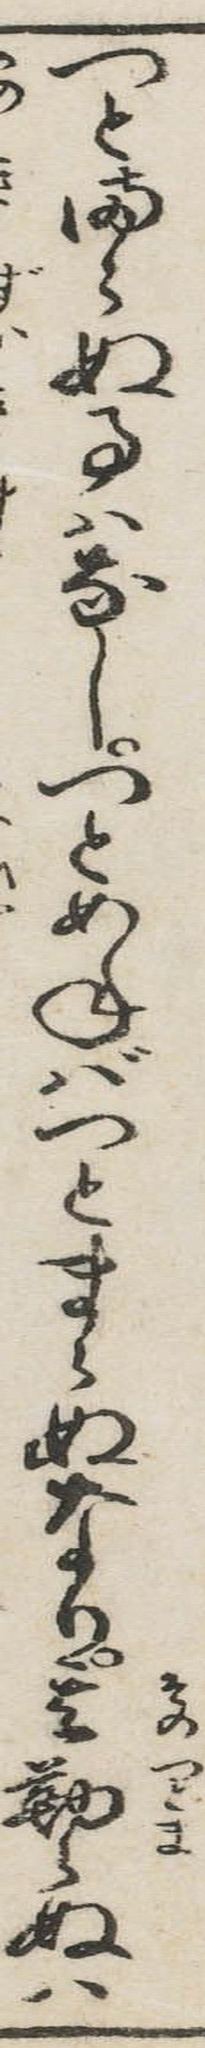つとまらぬ事はなし。つとめねばつとまらぬなり。其勤らぬは
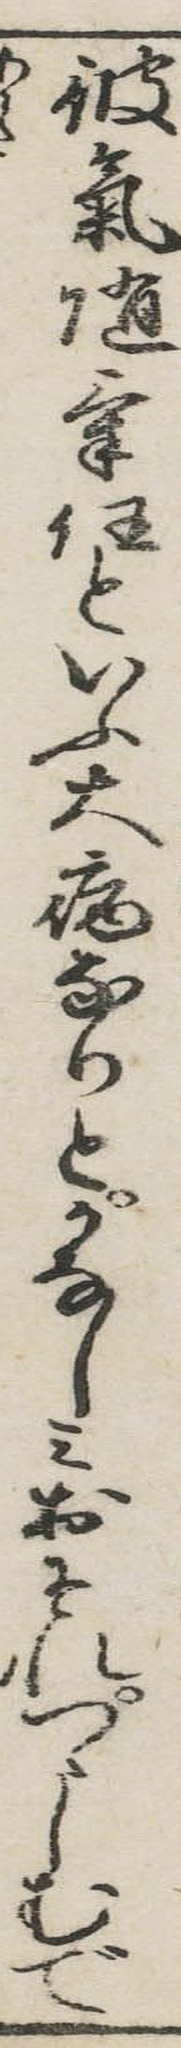彼気随気任といふ大病なりと。かなしみおそれ。つゝしむで
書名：前訓
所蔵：東京学芸大学附属図書館
